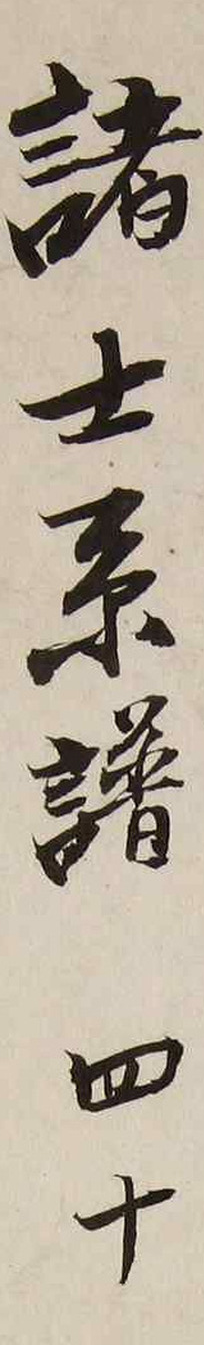諸士系譜四十
